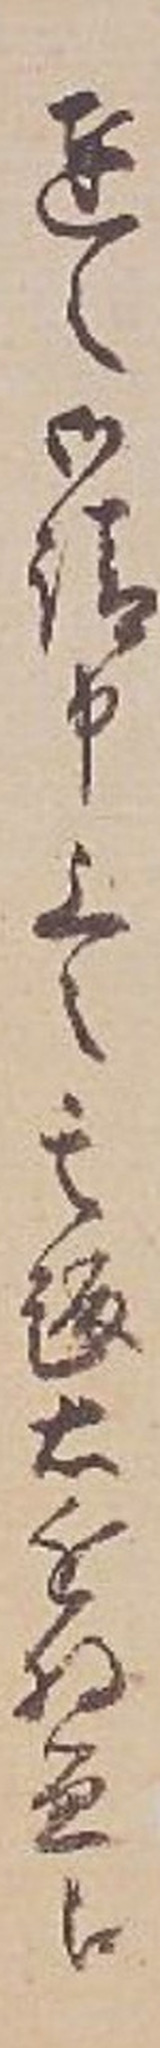達之御請申上之其趣右近将監え
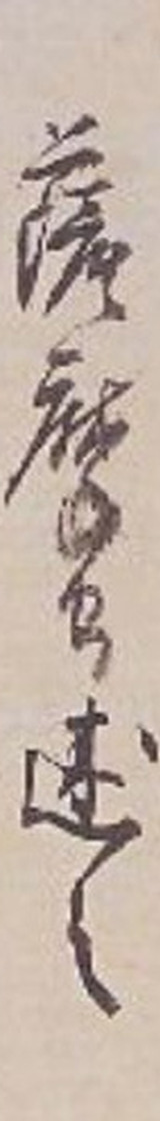薩摩守述之
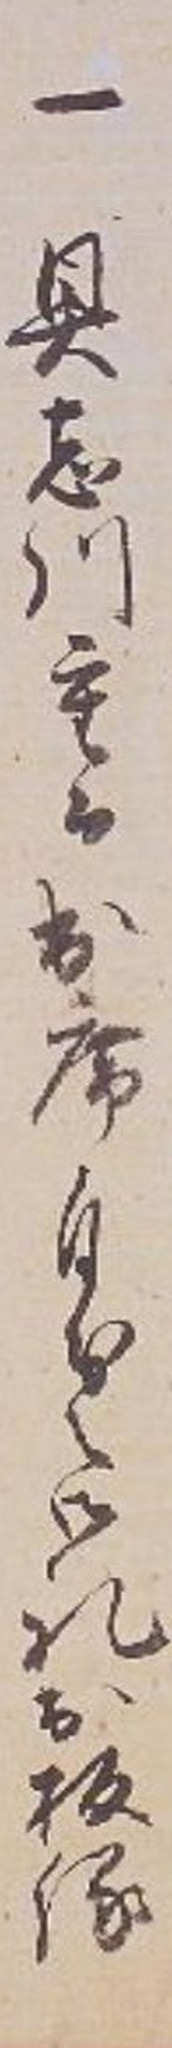一具志川重而出席自分之御礼於板縁
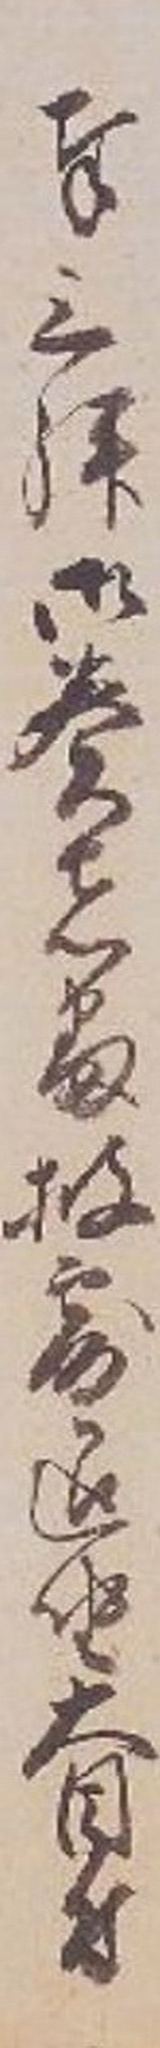奉三拝御奏者番披露退坐大目付
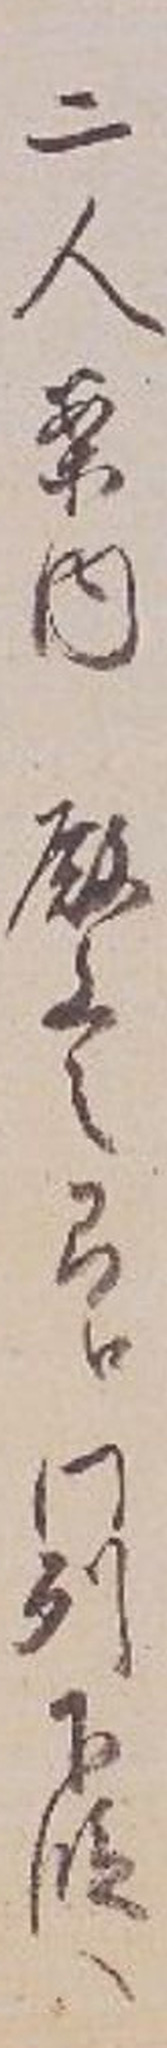二人案内殿上之間え同列下段へ
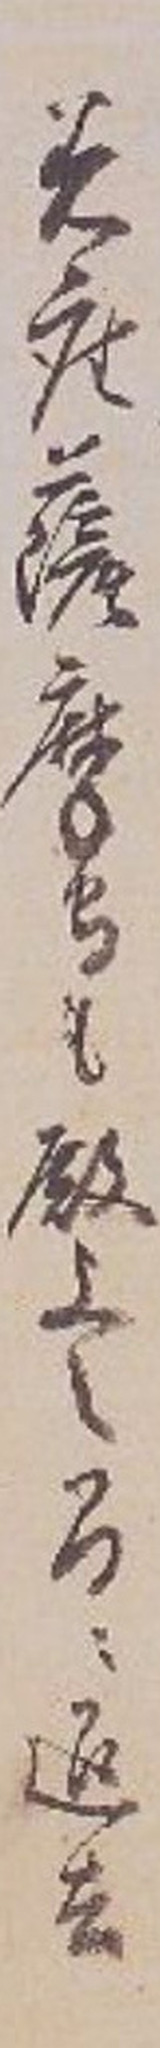着座薩摩守も殿上之間に退去
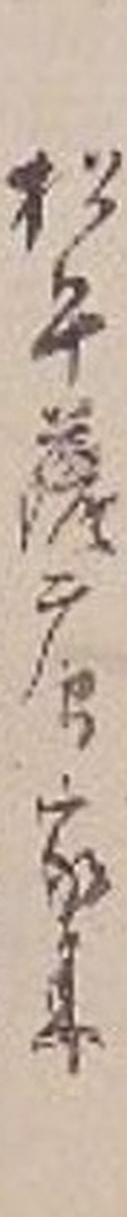松平薩摩守家来
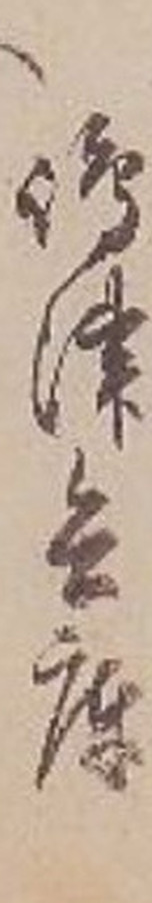島津兵庫

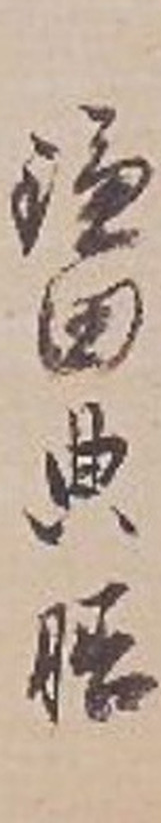鎌田典膳
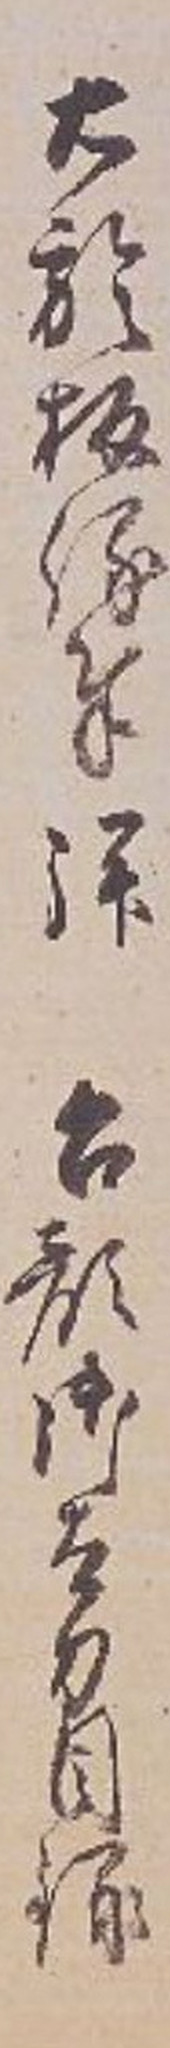右於板縁奉拝台顔御太刀目録
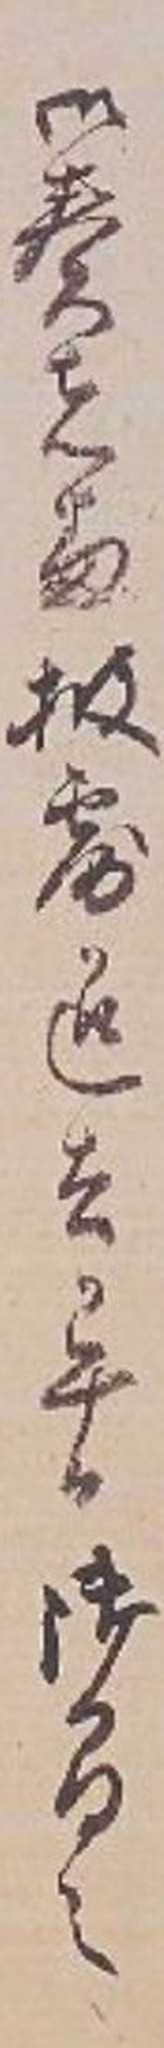御奏者番披露退去畢而御間之
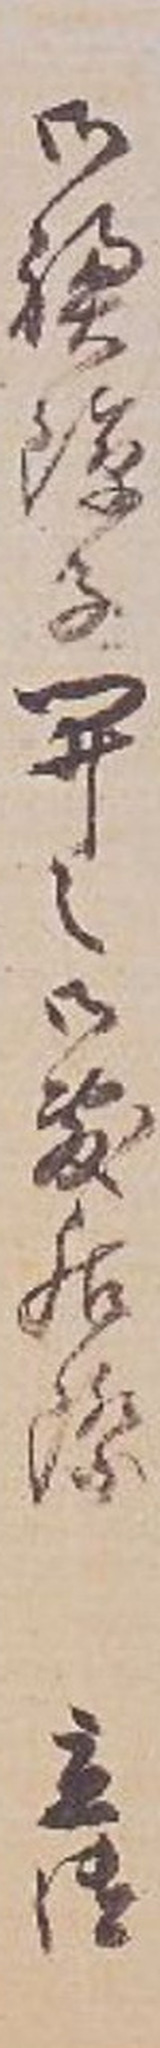御襖障子開之御敷居際立御
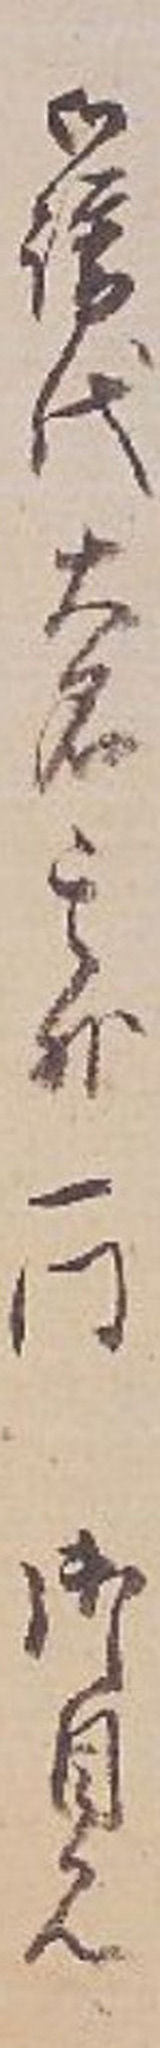御譜代大名其外一同御目見
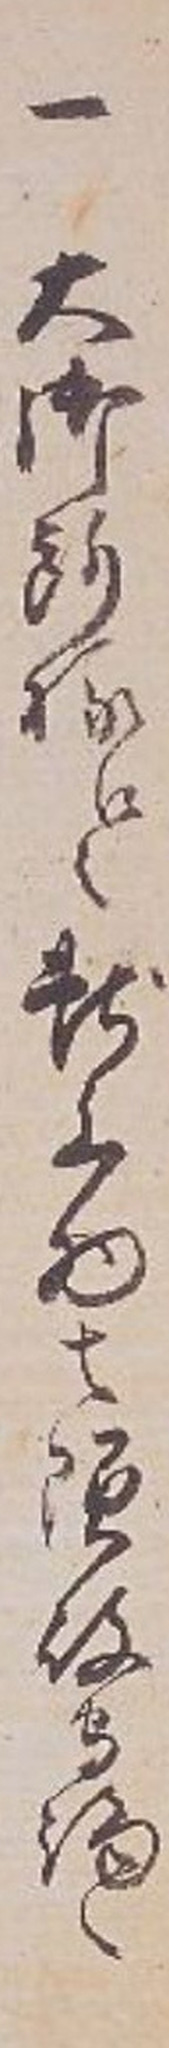一大御所様え之献上物は隠岐守謁之
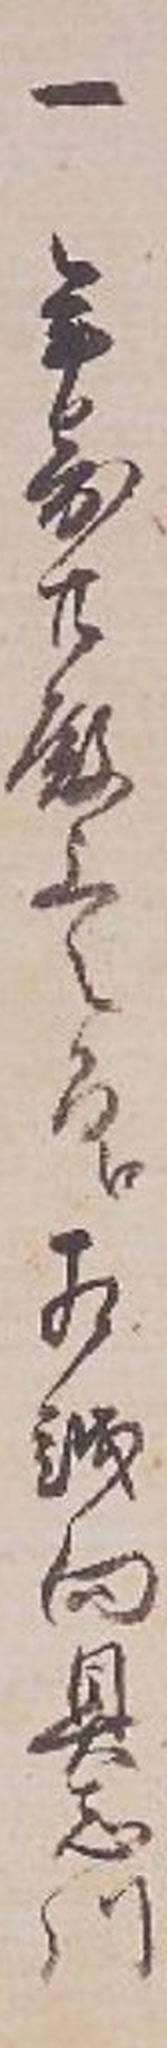一年寄共殿上之間え相越向具志川
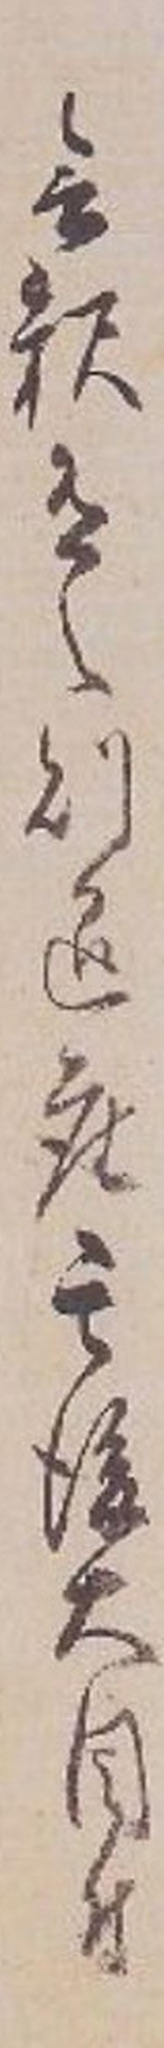会釈有之則退座其後大目付
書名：琉球人来朝記 五、六、七
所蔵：University of the Ryukyus Library
